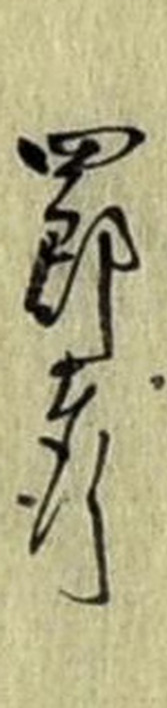四郡奉行
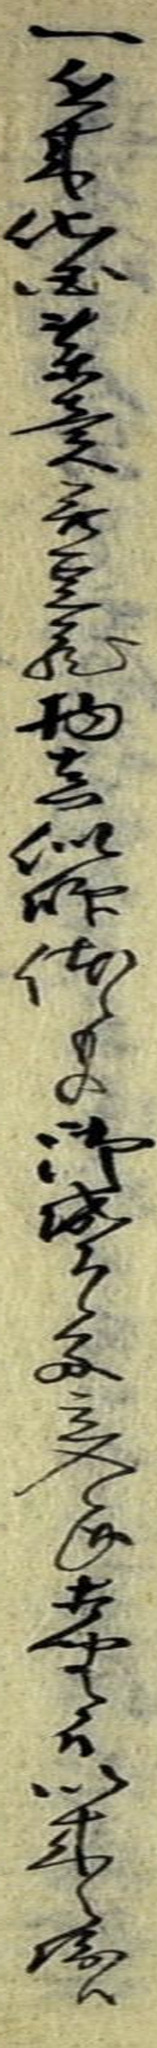一近来他国薬売并豆蔵物真似師体之もの御城下へ多立入候趣相聞候ニ付以来之儀ハ
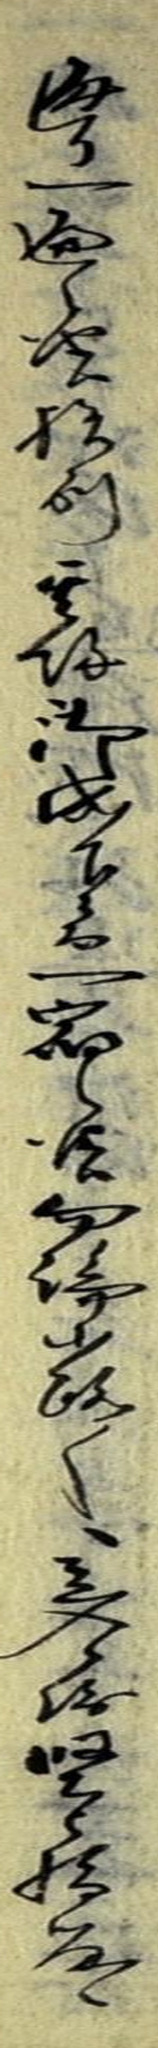通り一遍之儀ハ格別其余御城下ニ而一宿之儀ハ勿論孤小路〳〵へ立入候儀堅被指留候

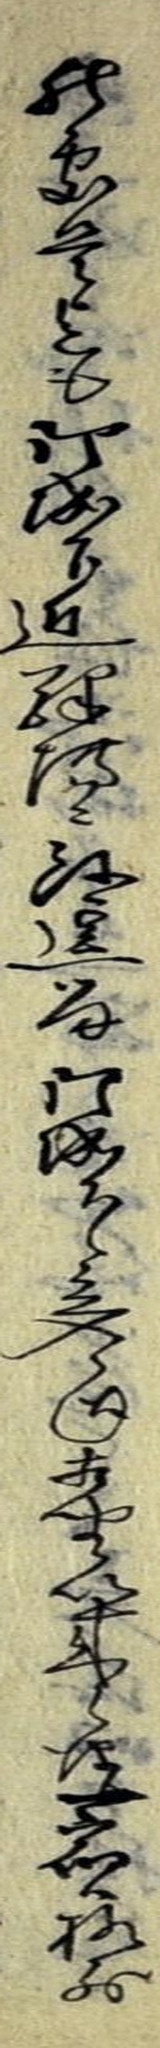然処是迄も御城下近駅場ニ致逗留御城下へ立入候趣相聞候以来之儀一宿ハ格別
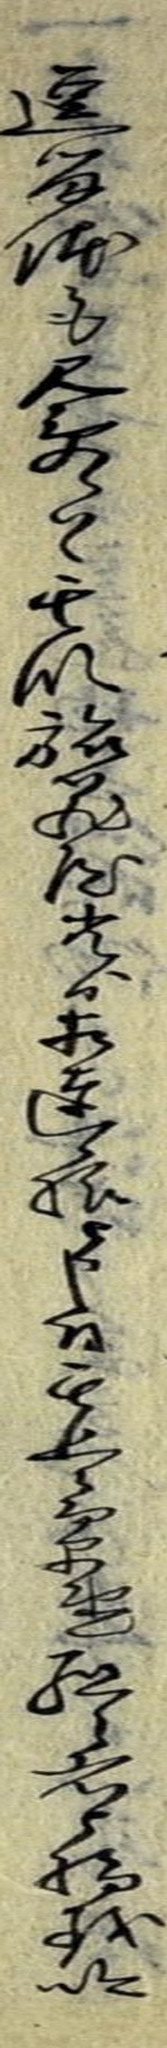逗留体ニも見受候ハヽ其段旅籠屋共ゟ相達候様被申付其上ニ而早速組之者被指越吟
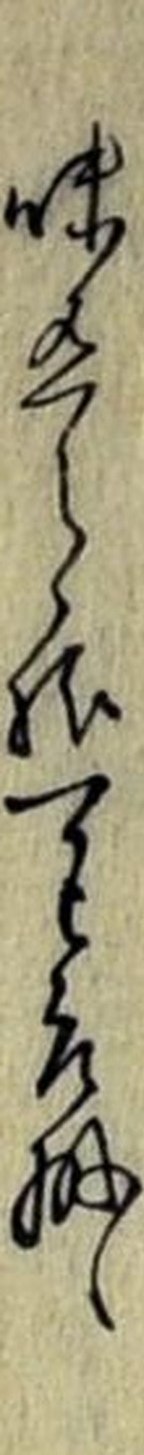味有之候様可被取扱候
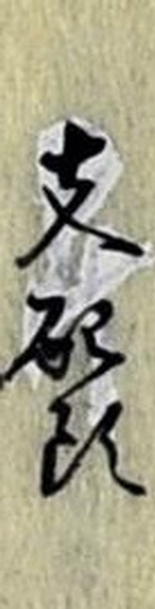支配頭
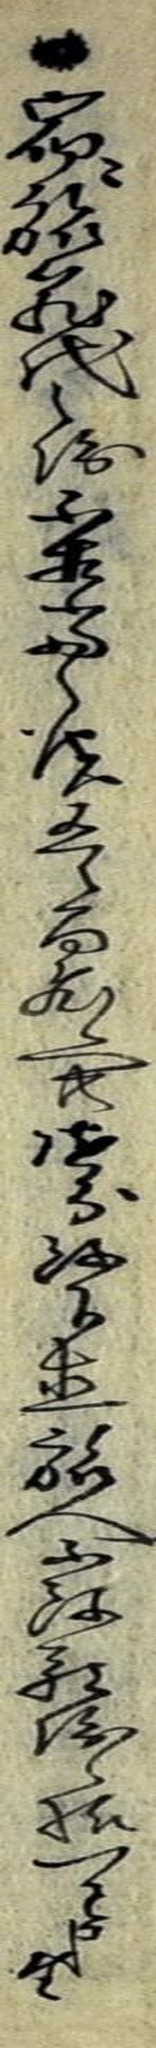〇宿々旅籠代之儀不相当之儀ハ有之間敷候へ共随分致下直旅人不致難儀候様可被申付候
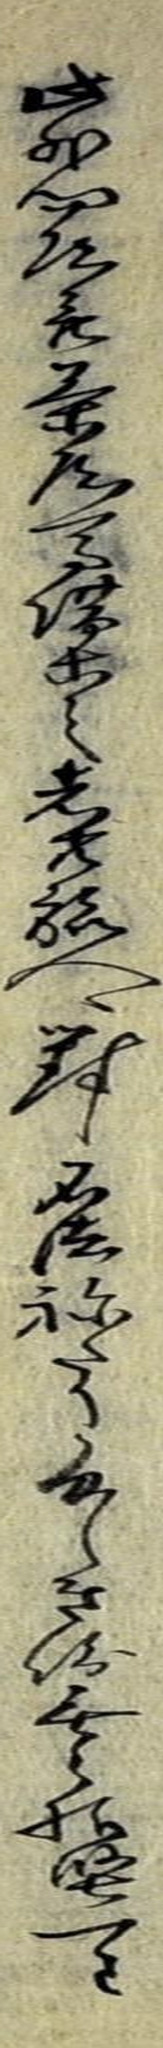此外問屋并茶屋馬借等之者共旅人へ対し不法ねたりかましき儀無之様堅可被
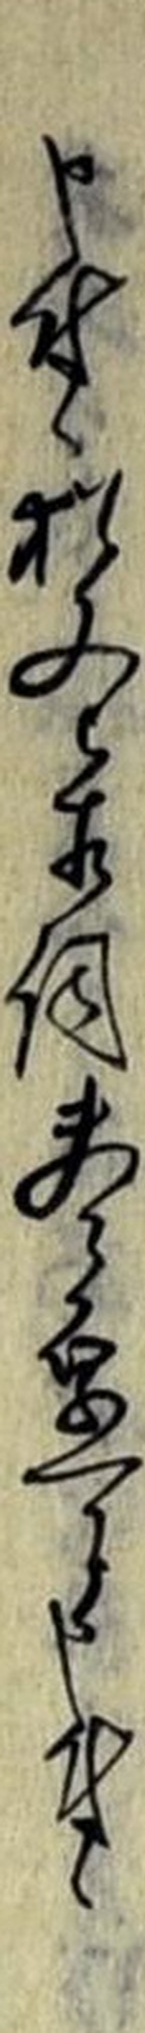申付候猶又被相伺夫々厚可被申付候
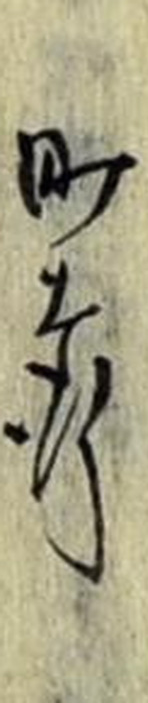町奉行
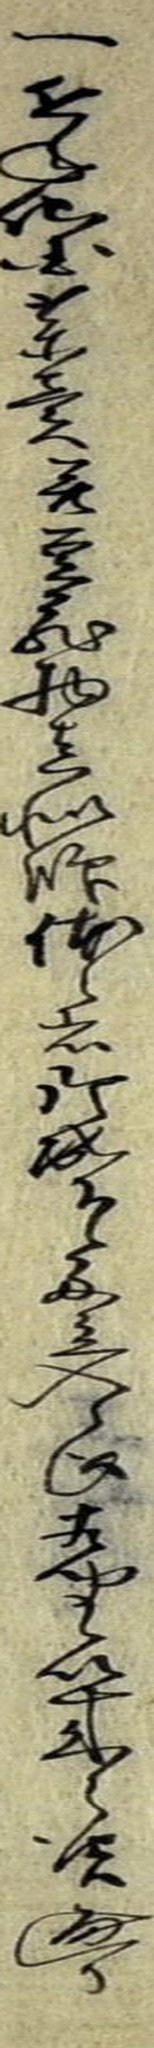一近年他国薬売并豆蔵物真似師体之者御城下へ多立入候趣相聞候以来之儀ハ通り
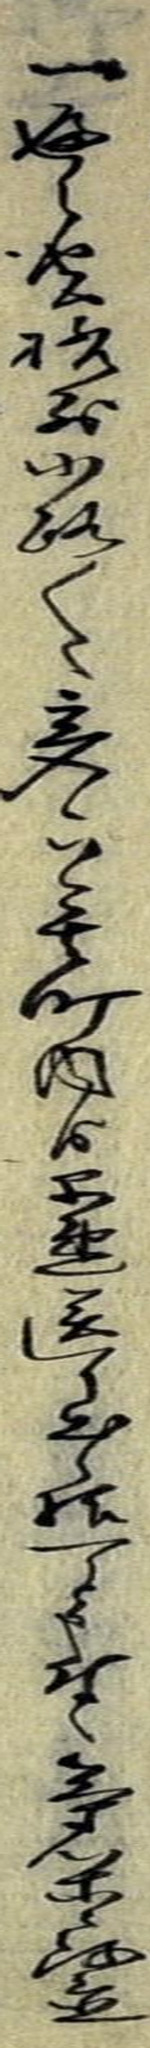一遍之儀ハ格別小路〳〵へ立入候ハ其町内ゟ早速送り出候様可被申付候等閑ニ致置
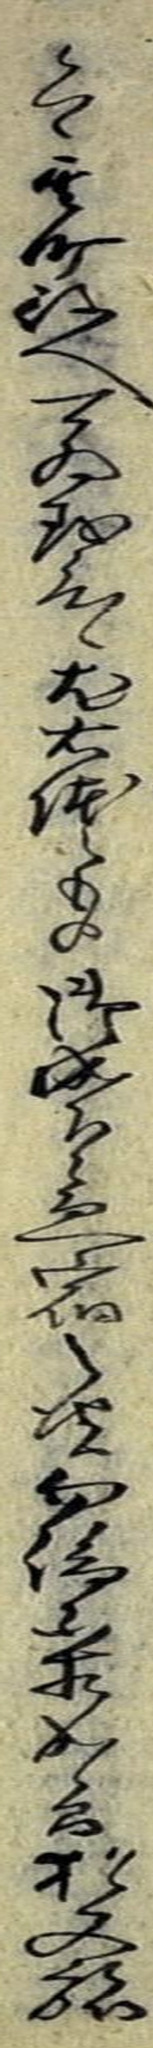候ハヽ其町役人可為越度候尤右体之もの御城下ニ而一宿之儀ハ勿論不相成候間猶又旅
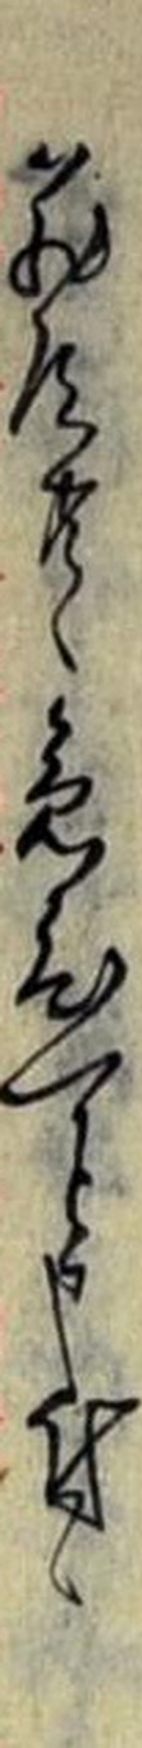籠屋共へ急度可被申付候
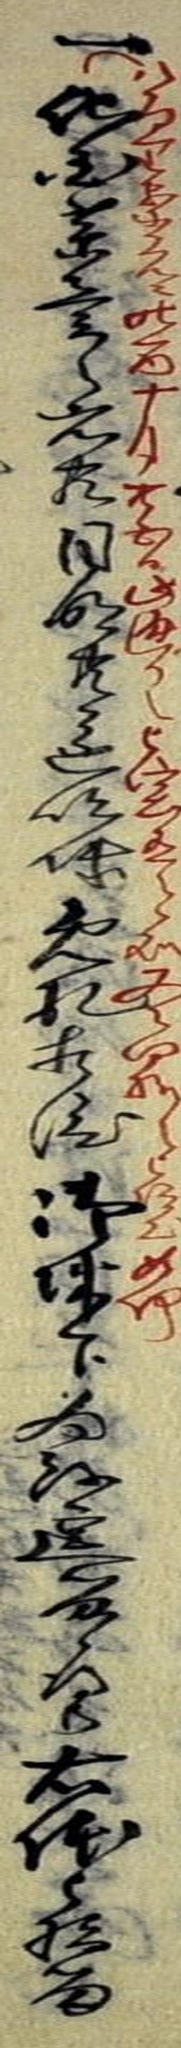一他国薬売之者共目明共遂吟味免札相渡御城下為致逗留候得共右体被指留
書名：命令之部 三
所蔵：福井県文書館 Fukui Prefectural Archives
